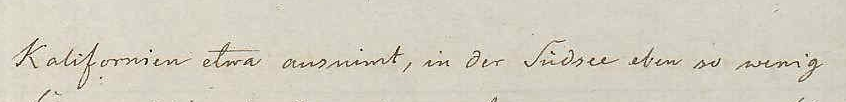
Kalifornien etwa ausnimt, in der Südsee eben so wenig
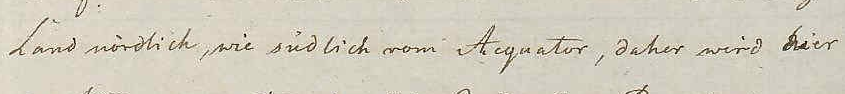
Land nördlich, wie südlich vom Aequator, daher wird dehier
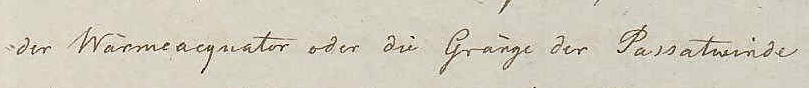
der Wärmeaequator oder die Gränze der Passatwinde
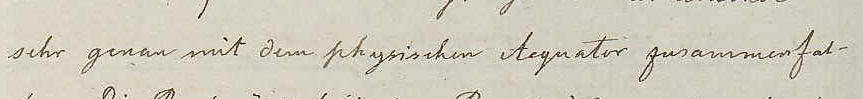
sehr genau mit dem physischen Aequator zusammenfal-
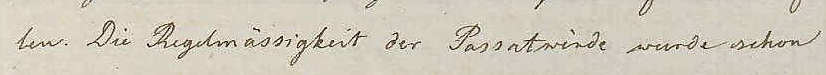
len. Die Regelmässigkeit der Passatwinde wurde schon
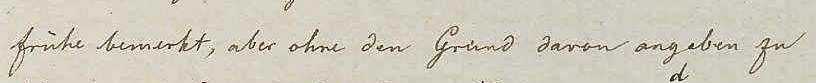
frühe bemerkt, aber ohne den Grund davon angeben zu
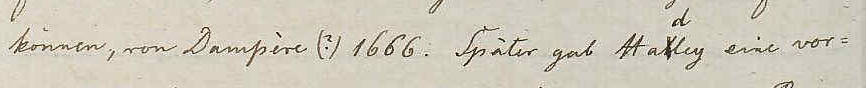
können, von Dampère 1666. Später gab Haldley eine vor-
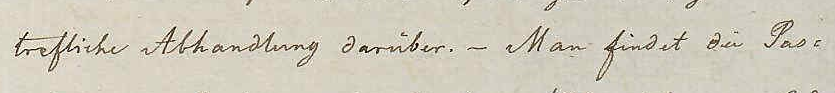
trefliche Abhandlung darüber. – Man findet die Pas-
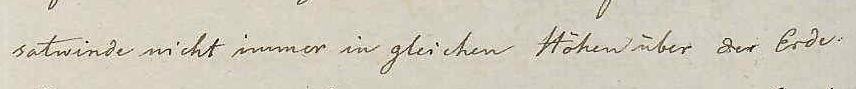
satwinde nicht immer in gleichen Höhen über der Erde:
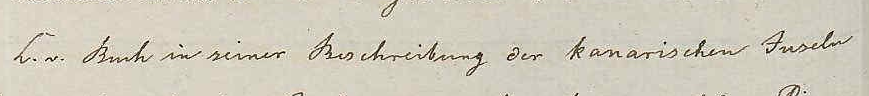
L. v. Buch in seiner Beschreibung der kanarischen Inseln
